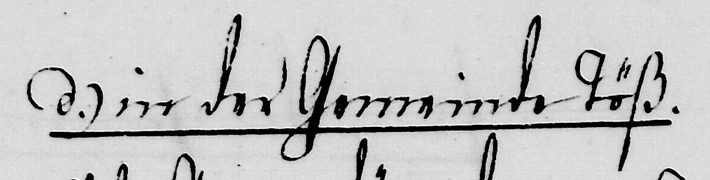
d. in der Gemeinde Töß.
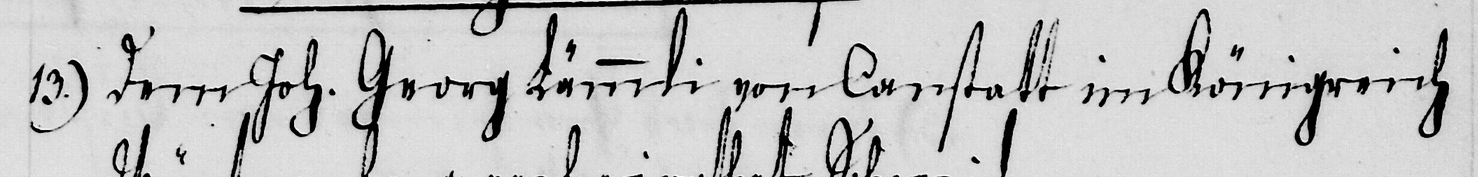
13.) Dem Joh. Georg Lämmli von Canstatt im Königreich
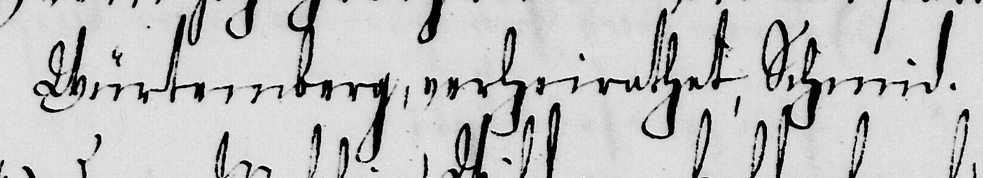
Würtemberg, verheirathet, Schmid.
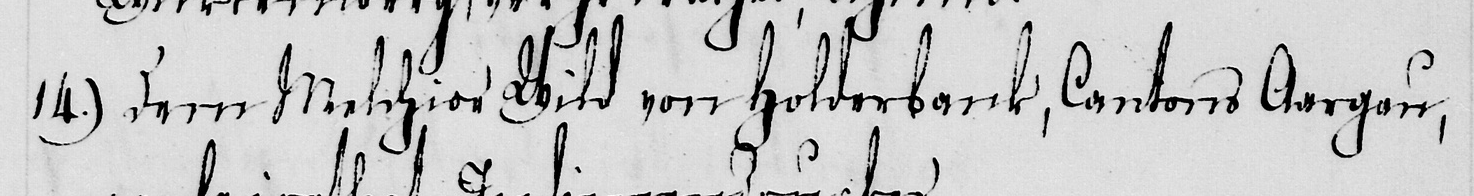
14.) Dem Melchior Wild von Holderbank, Cantons Aargau,
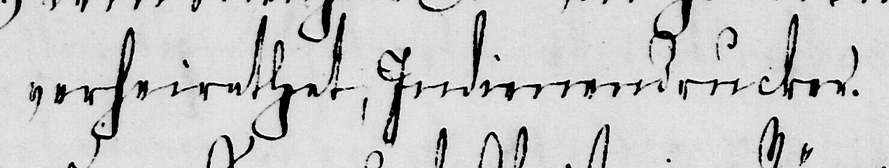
verheirathet, Indienendrucker.
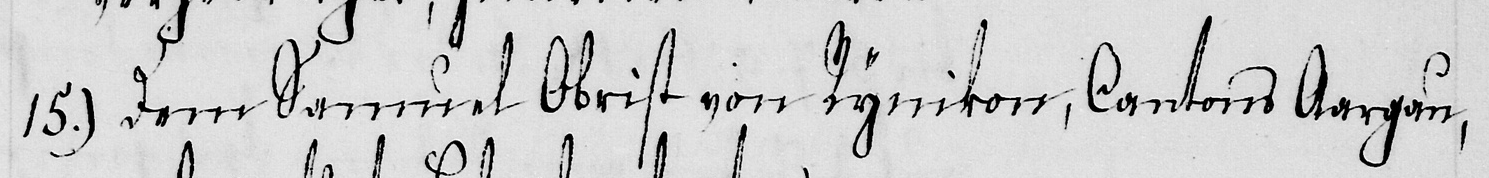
15.) Dem Samuel Obrist von Rynikon, Cantons Aargau,
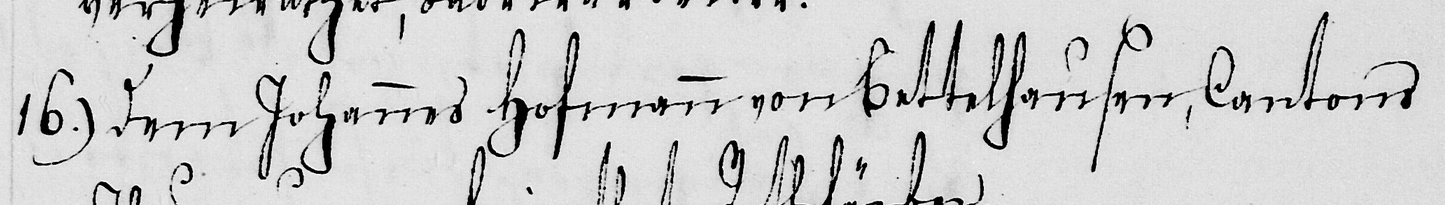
16.) Dem Johannes Hofmann von Bettelhausen, Cantons
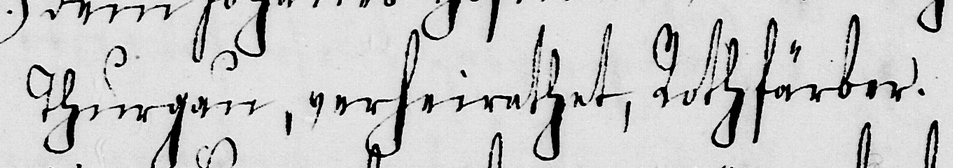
Thurgau, verheirathet, Rothfärber.
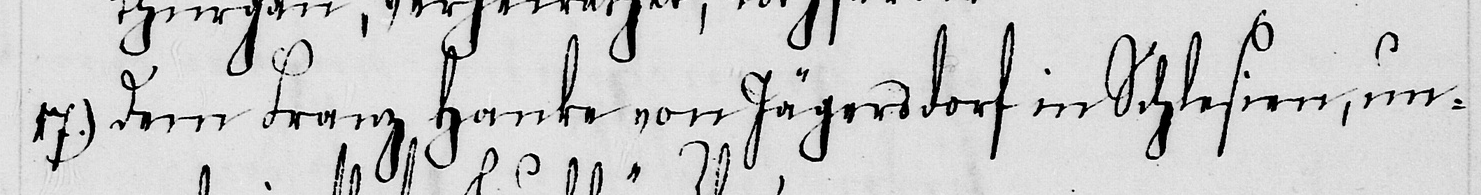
17.) Dem Franz Hanke von Jägersdorf in Schlesien, un¬
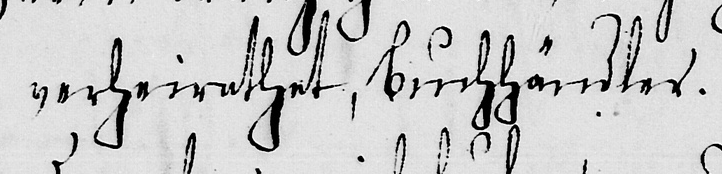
verheirathet, Buchhändler.
